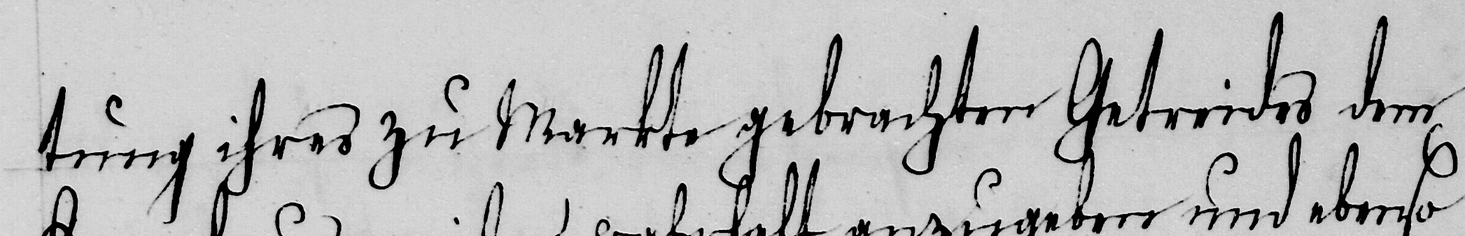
tung ihres zu Markte gebrachten Getreides dem
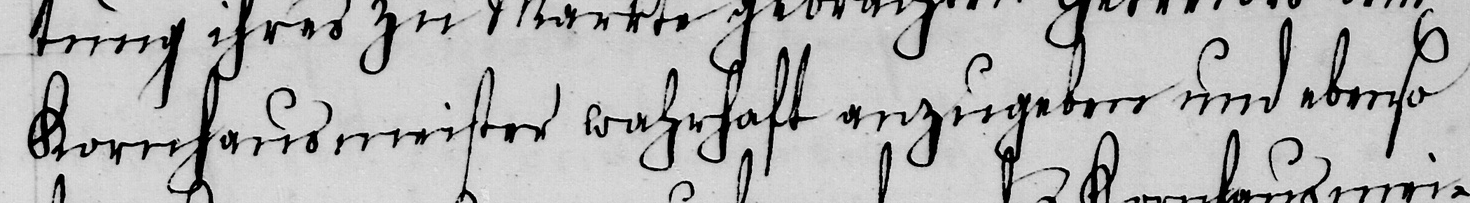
Kornhausmeister wahrhaft anzugeben und ebenso
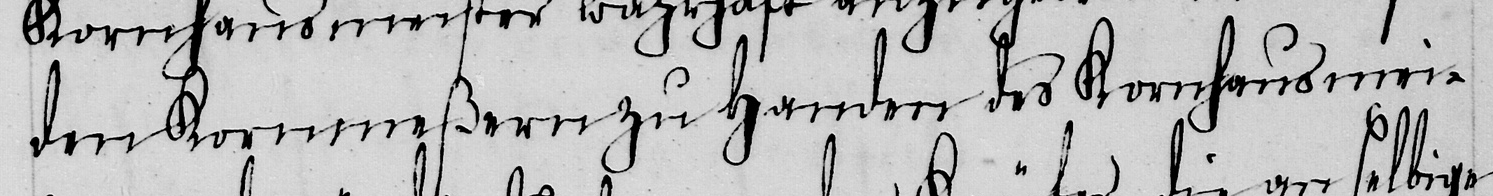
den Kornmeßern zu Handen des Kornhausmei¬
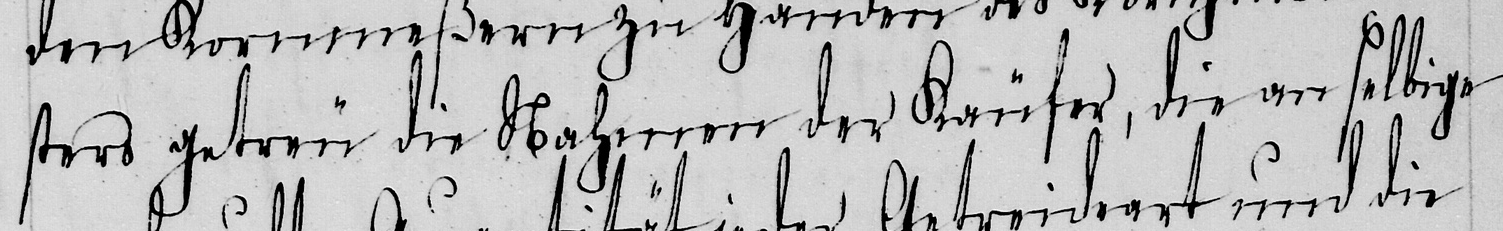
sters getreu die Nahmen der Käufer, die an selbige
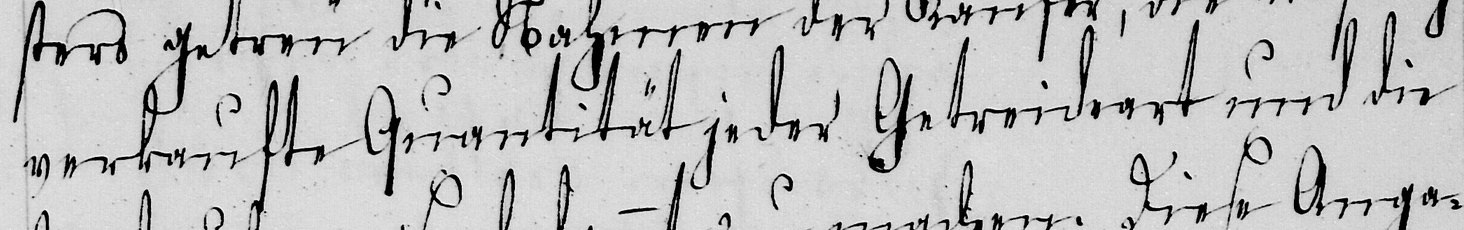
verkaufte Quantität jeder Getreideart und die
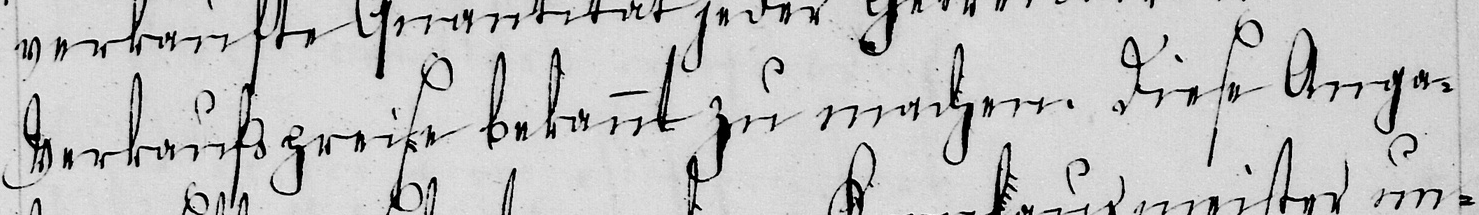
Verkaufspreise bekannt zu machen. Diese Anga¬
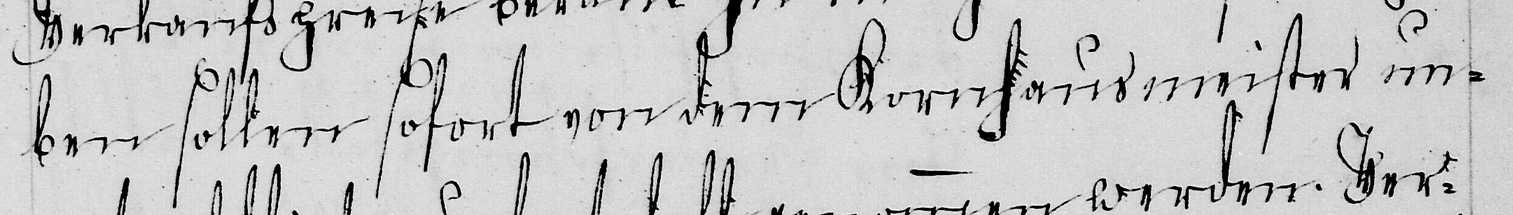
ben sollen sofort von dem Kornhausmeister un¬
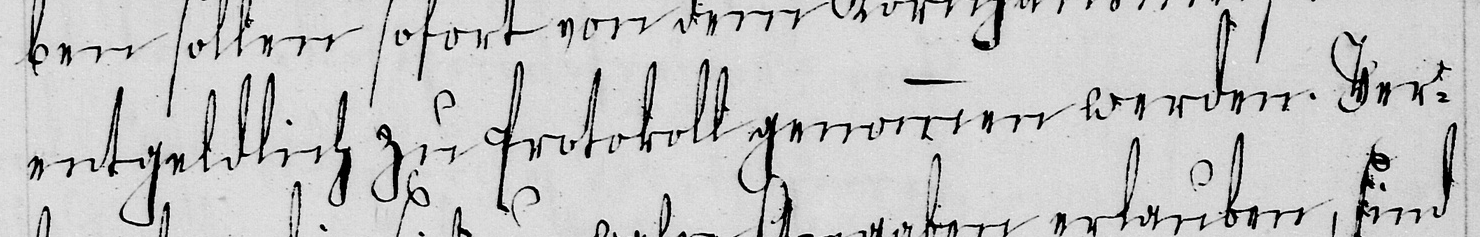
entgeldlich zu Protokoll genommen werden. Ver¬
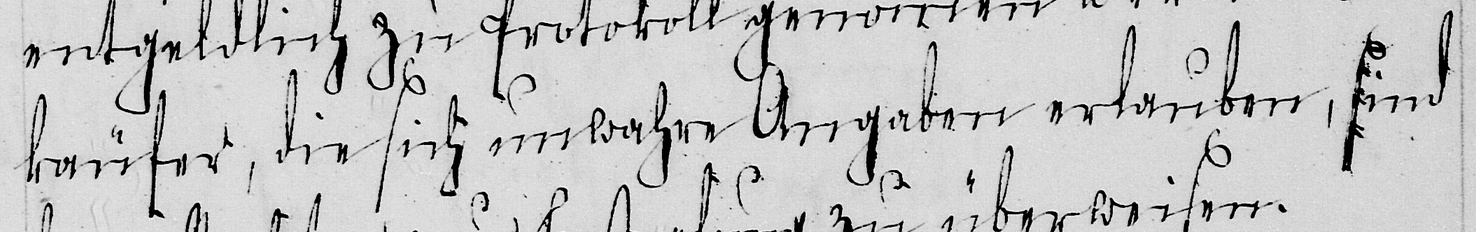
käufer, die sich unwahre Angaben erlauben, sind
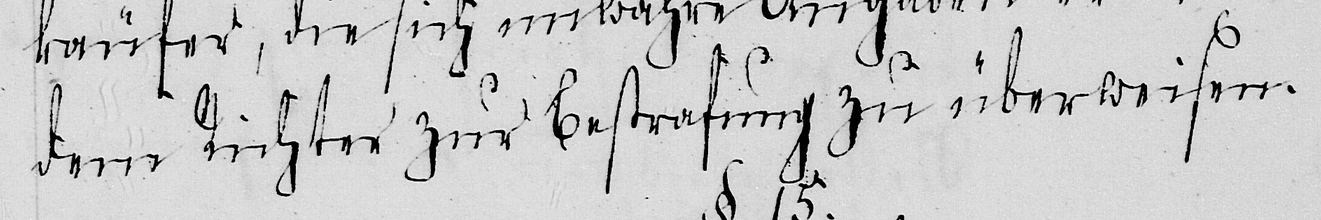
dem Richter zur Bestrafung zu überweisen.
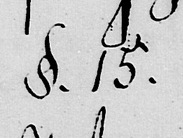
§. 15.
